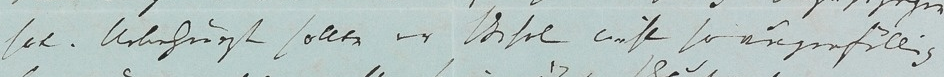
hat. Ueberhaupt sollte er Basel nicht so augenfällig
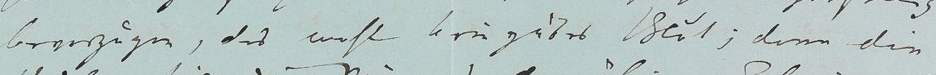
bevorzugen, das macht kein gutes Blut; denn die
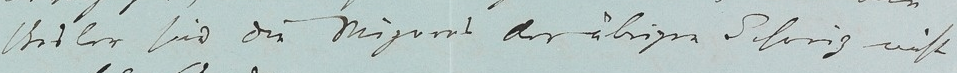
Basler sind die Mäzenas der übrigen Schweiz nicht
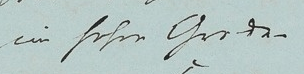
im hohen Grade.
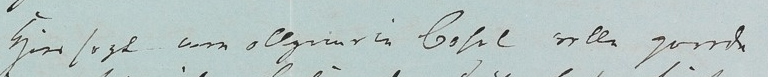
Hier sagt man allgemein Basel wolle gerade
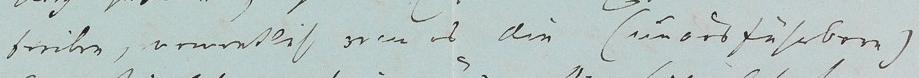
treiben, namentlich wenn es die (unausführbare)
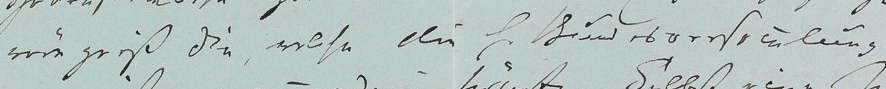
wäre gewiß die, welche die h. Bundesversammlung
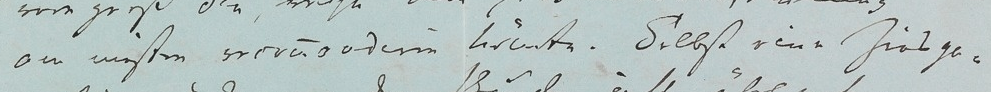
am meisten recommandiren könnte. Selbst eine Zinsga-
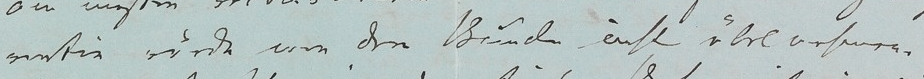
rantie würde man dem Bunde nicht übel nehmen.
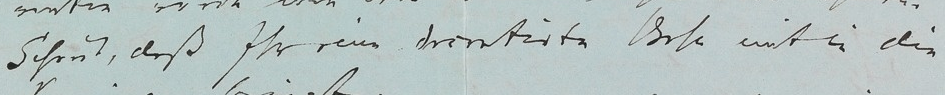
Schaut, daß Ihr eine decretirte Bahn mit in die
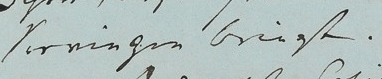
Provinzen bringt.
